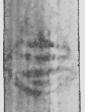周
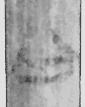公
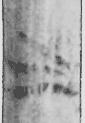之
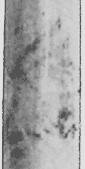頌
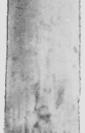志
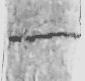一
